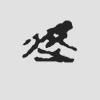退
